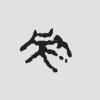風
